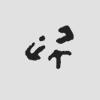民
